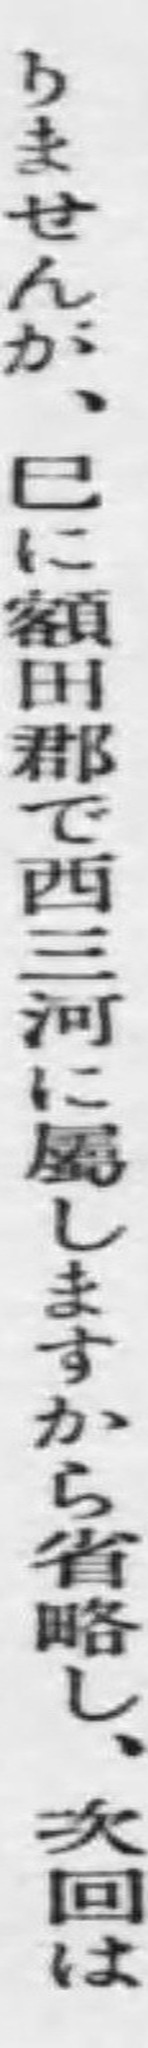りませんが、巳に額田郡で西三河に属しますから省略し、次回は
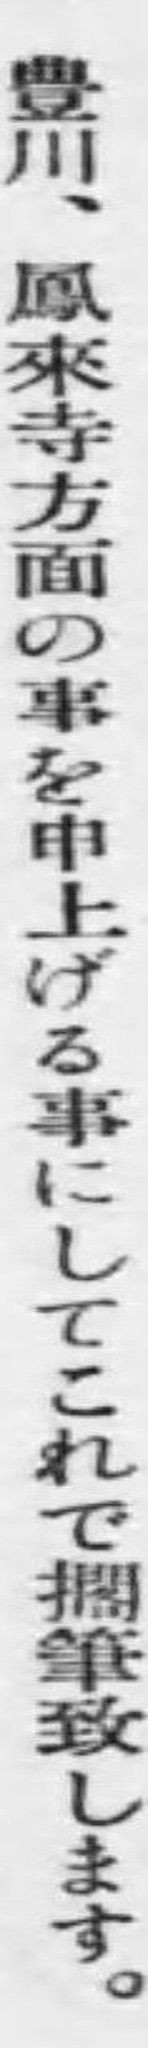豊川、鳳来寺方面の事を申上げる事にしてこれで擱筆致します。
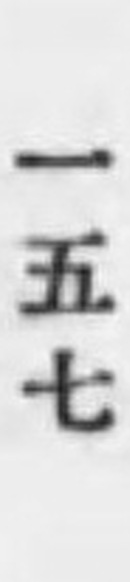一五七

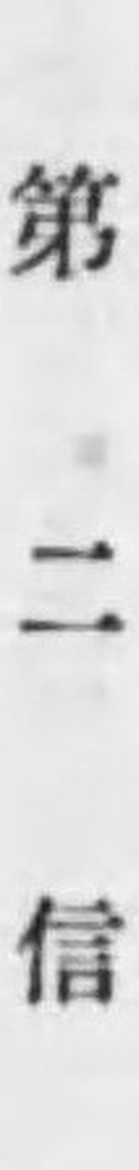第二信
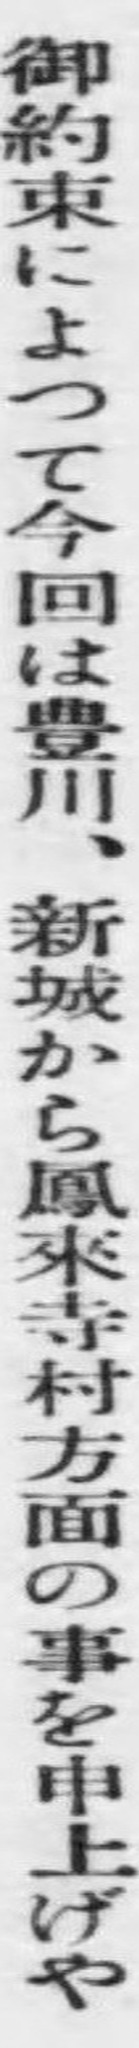御約束によつて今回は豊川、新城から鳳來寺村方面の事を申上げや
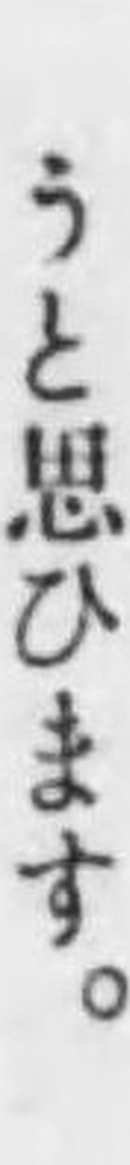うと思ひます。
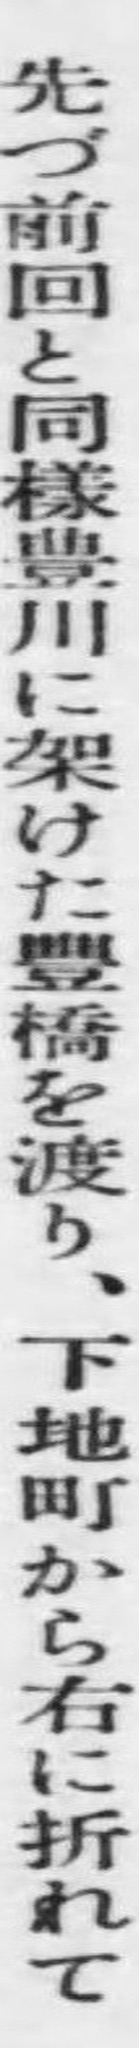先づ前回と同樣豊川に架けた豊橋を渡り、下地町から右に折れて
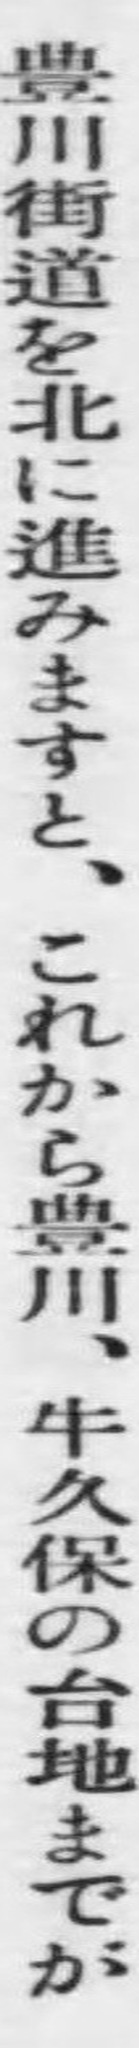豊川街道を北に進みますと、これから豊川、牛久保の台地までが
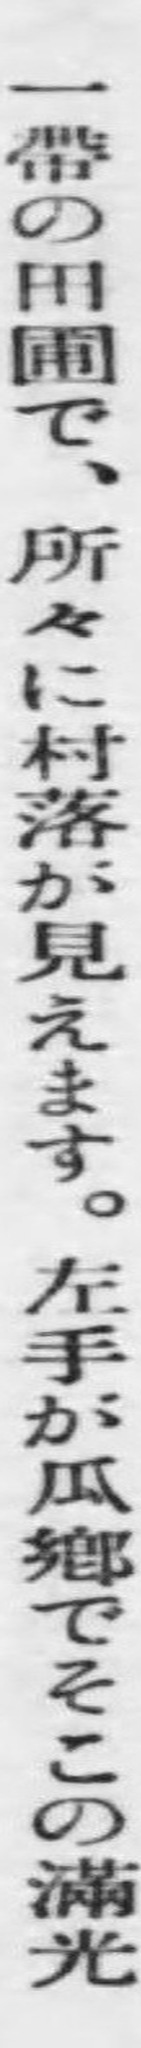一帶の田圃で、所々に村落が見えます。左手が瓜郷でそこの滿光
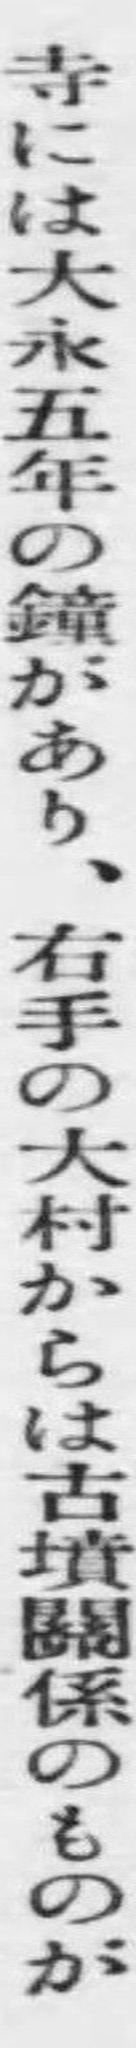寺には大永五年の鐘があり、右手の大村からは古墳關係のものが
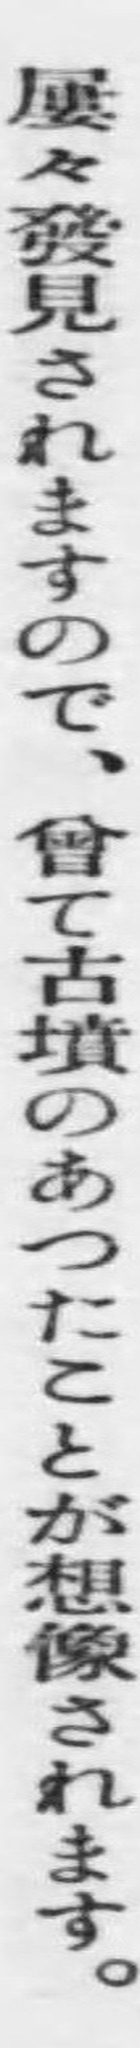屢々發見されますので、曾て古墳のあつたことが想像されます。
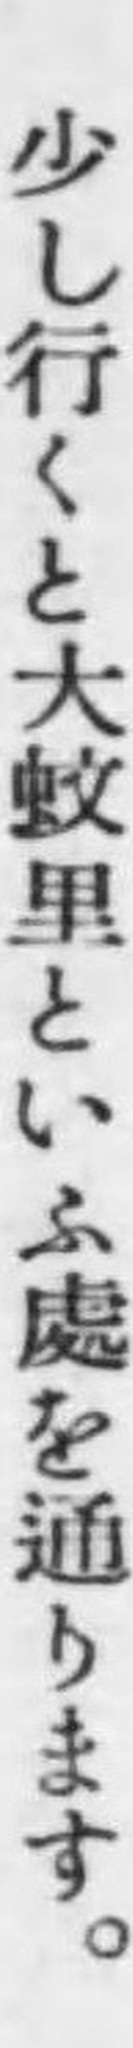少し行くと大蚊里といふ處を通ります。
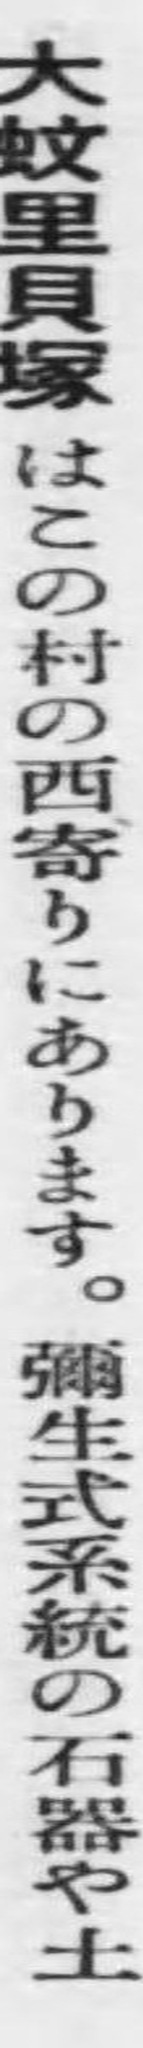大蚊里貝塚はこの村の西寄りにあります。彌生式系統の石器や土
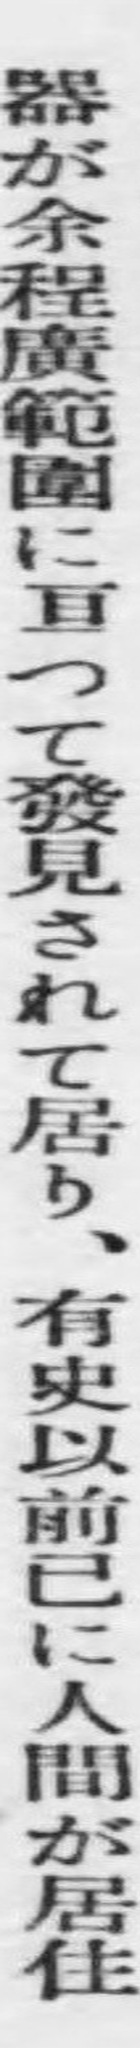器が余程廣範圍に亘つて發見されて居り、有史以前已に人間が居住

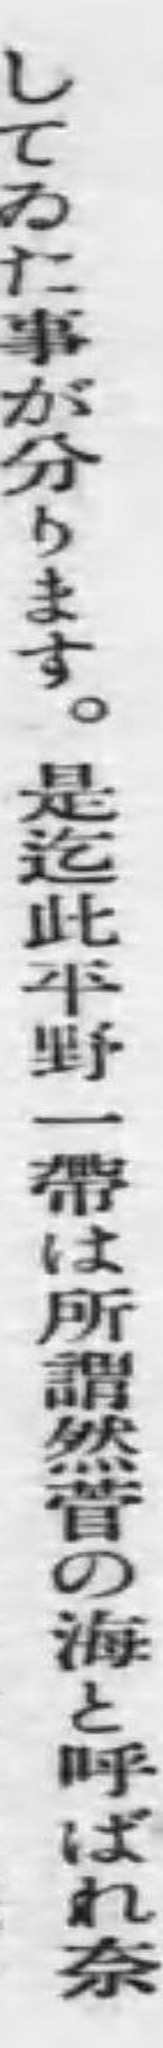してゐた事が分ります。是迄此平野一帶は所謂然菅の海と呼ばれ奈
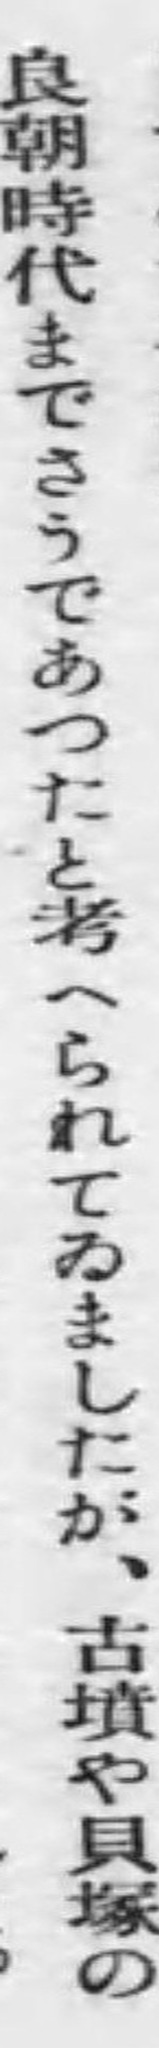良朝時代までさうであつたと考へられてゐましたが、古墳や貝塚の
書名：東三河道中記 : 豊橋市及其附近案内
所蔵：国立国会図書館 National Diet Library, JAPAN
